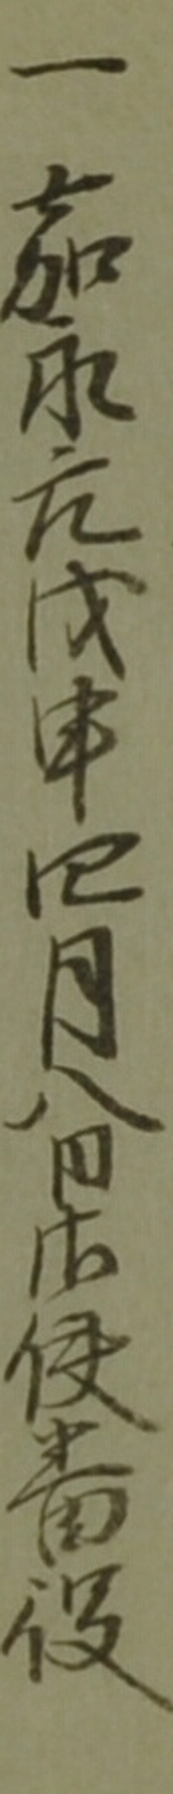一嘉永元戊申四月八日御使番役
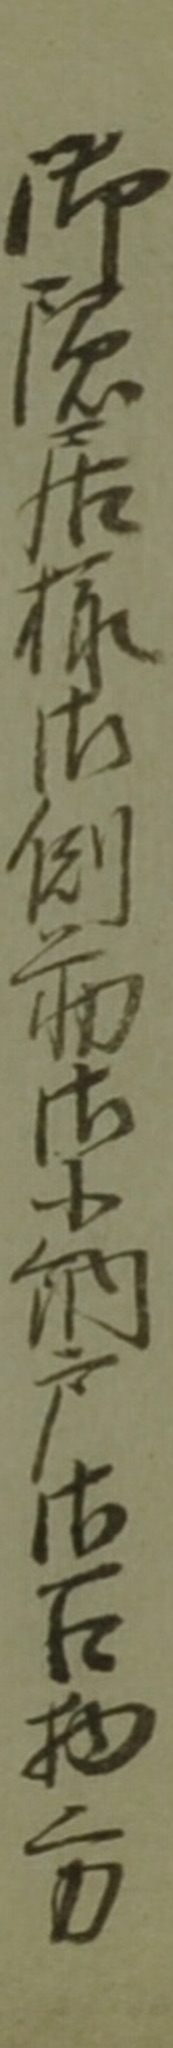御隠居様御側勤御小納戸御召物方
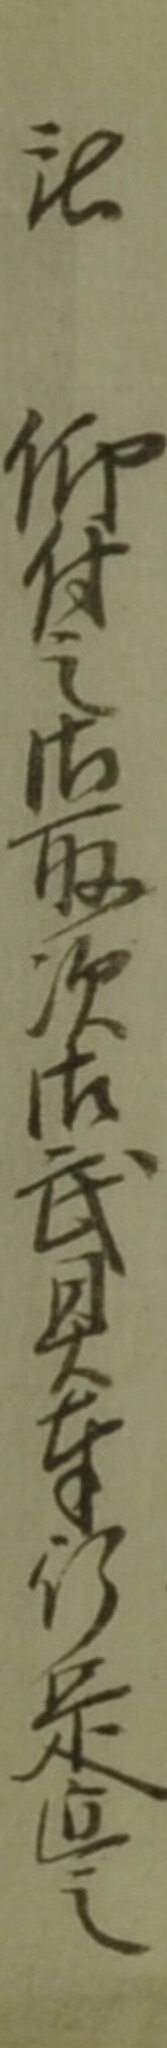被仰付之御取次御武具奉行是迄之
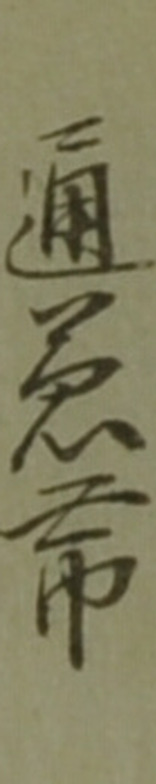通兼帯
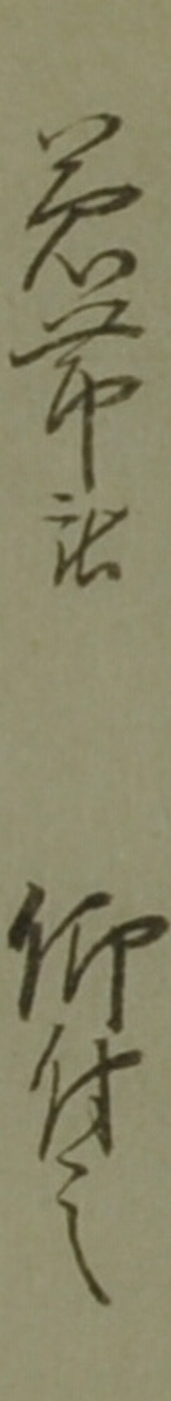兼帯被仰付之
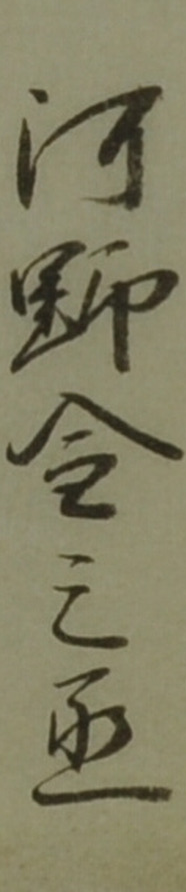河野金之丞
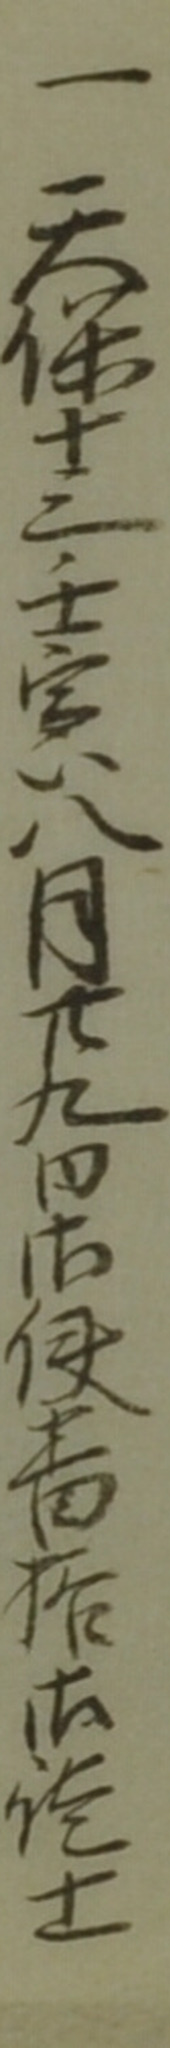一天保十三壬寅八月廿九日御使番格御徒士
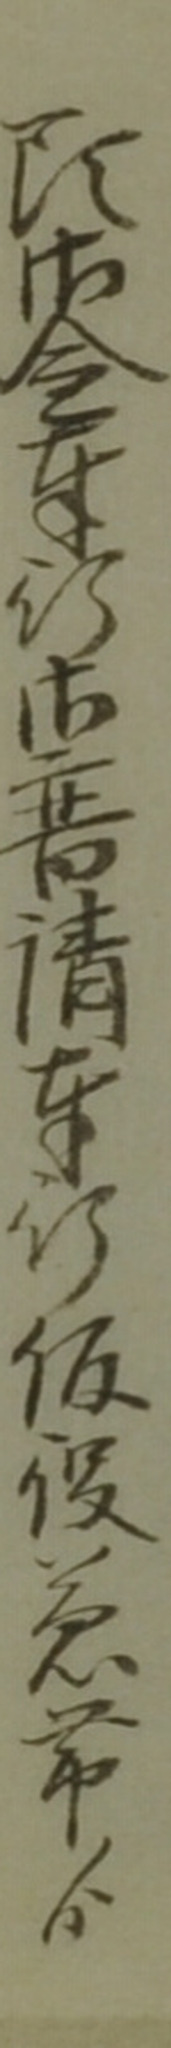頭御金奉行御普請奉行仮役兼帯ゟ
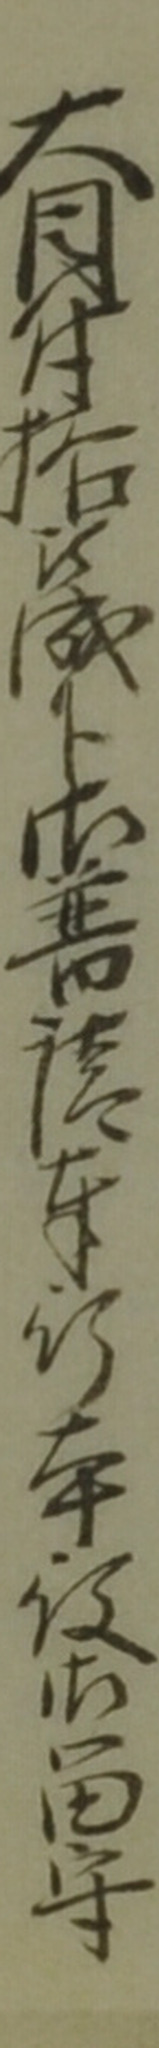大目付格被成下御普請奉行本役御留守
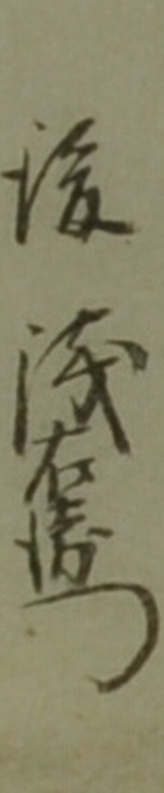後浅右衛門
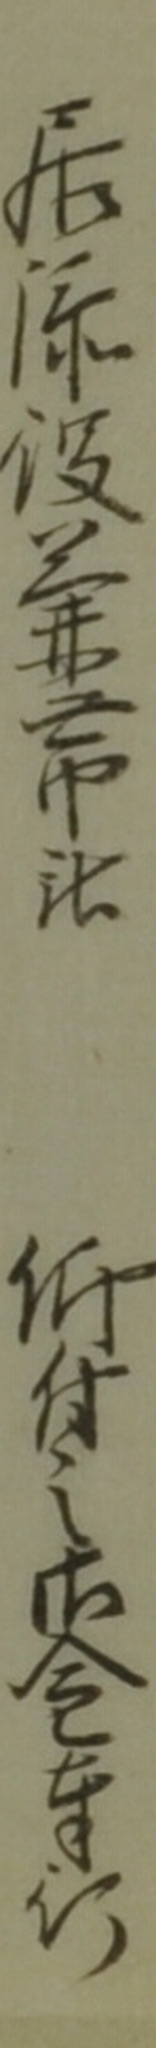居添役兼帯被仰付之御金奉行
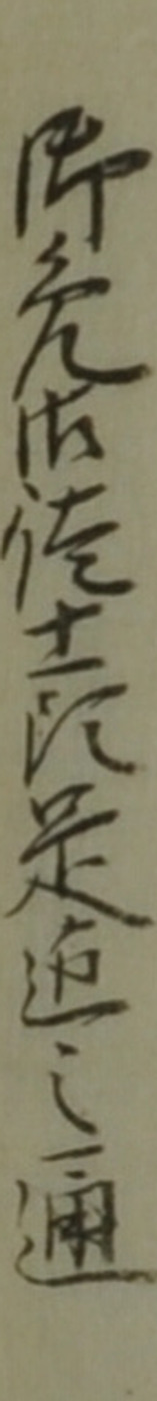御免御徒士頭是迄之通
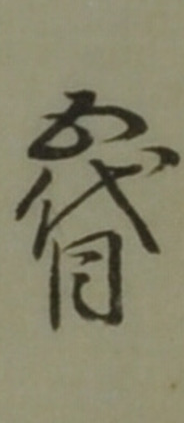五代目
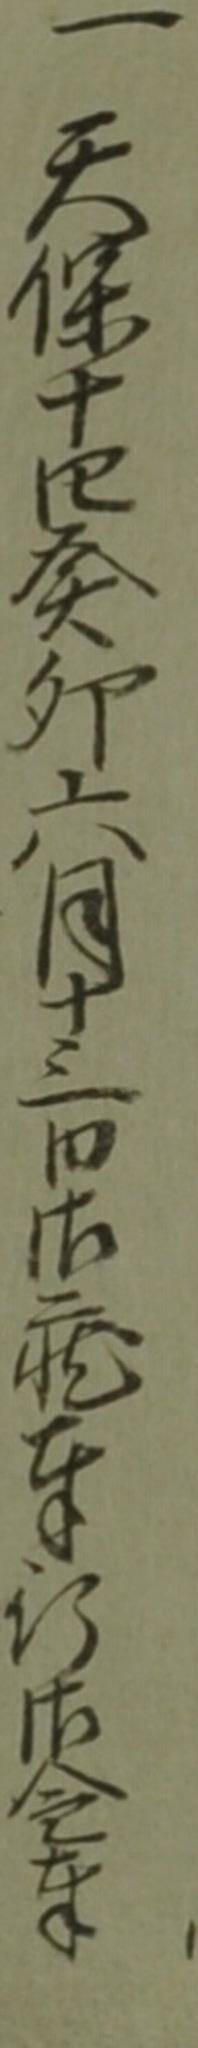一天保十四癸卯六月十三日御蔵奉行御金奉
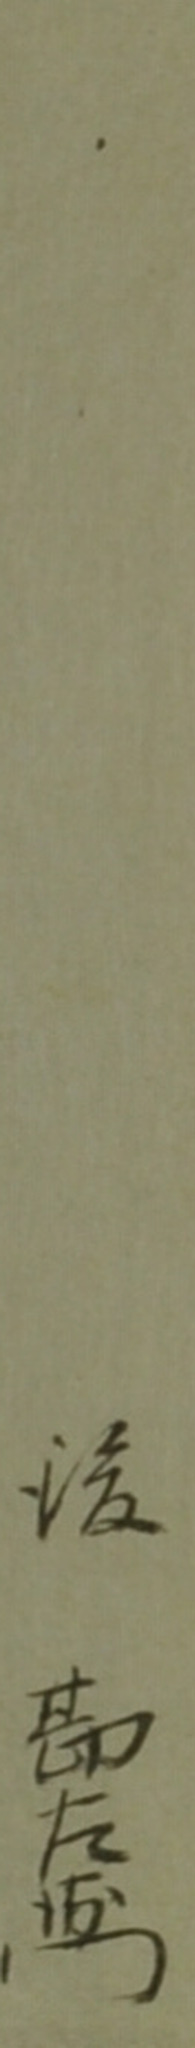後勘左衛門
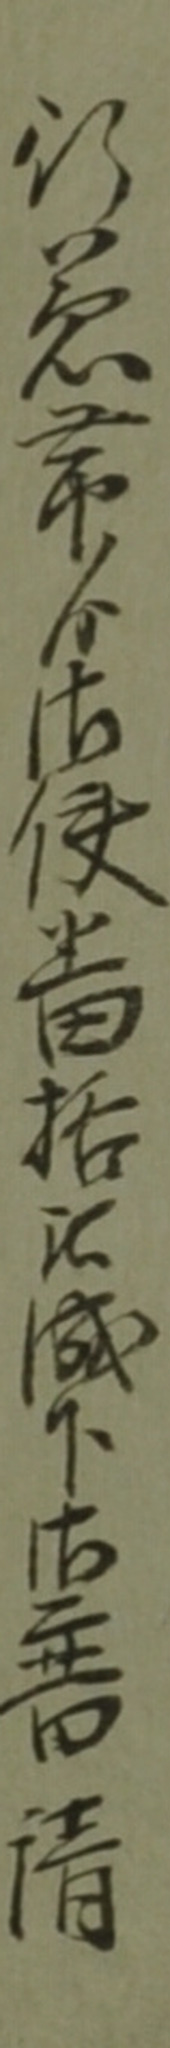行兼帯ゟ御使番格被成下御普請
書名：諸御役代々録（六）
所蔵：伊那市立高遠町図書館・合同会社AMANE
